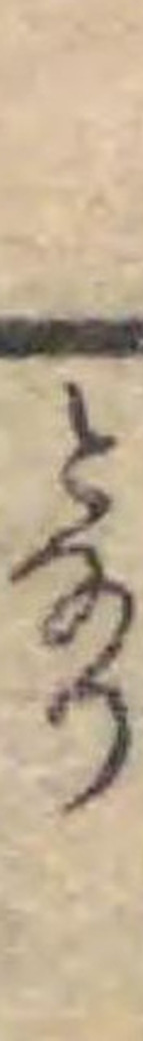となり
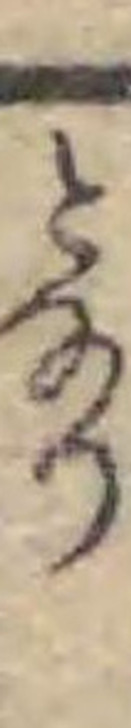となり
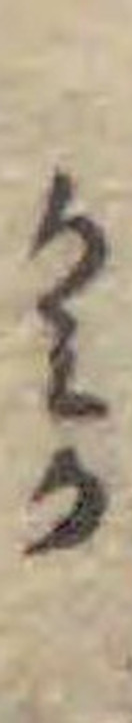かみか
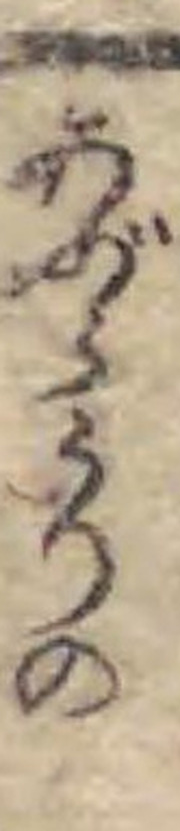あぶらうりの
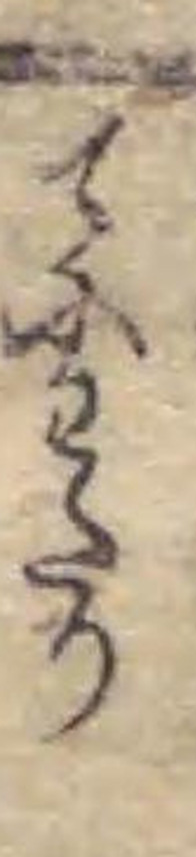てにわたり
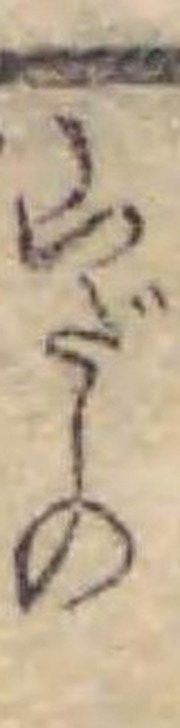山だしの
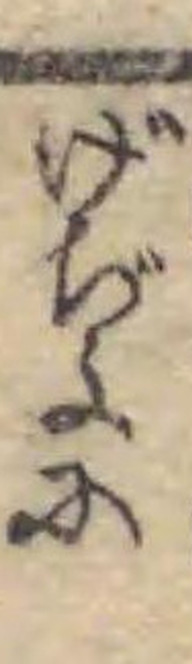げぢよに
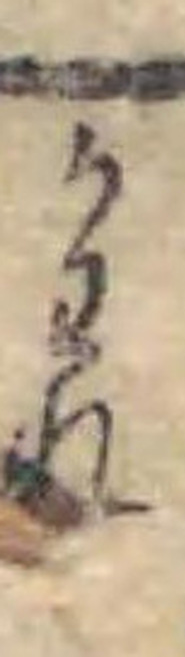かわれ
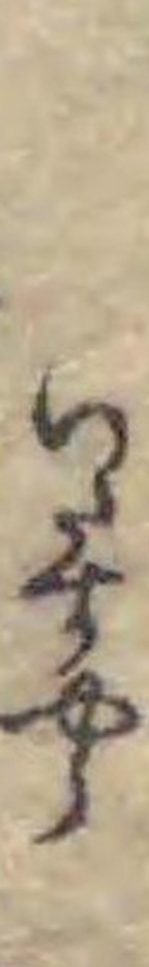いたすやら
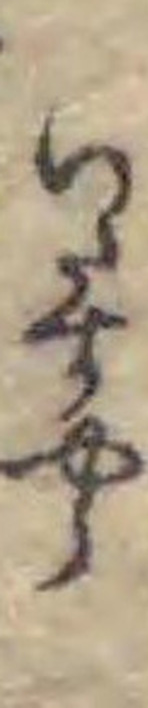いたすやら
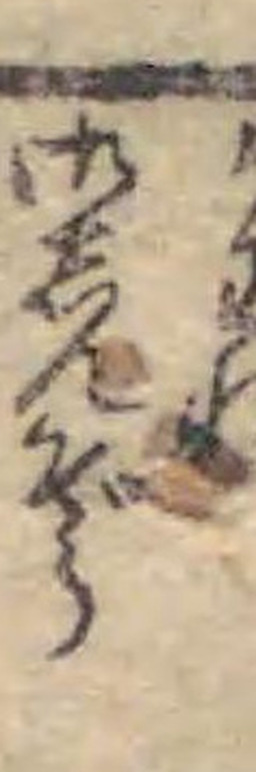御しんぞう
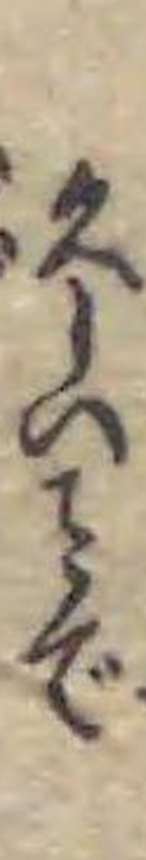久しいことで
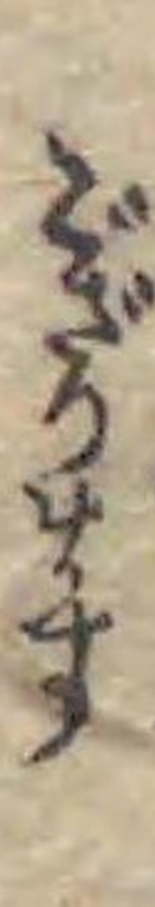ござります
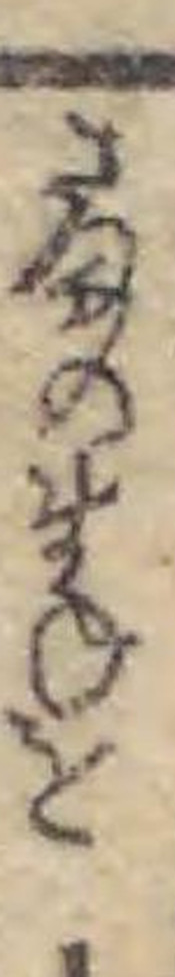さまのまねを
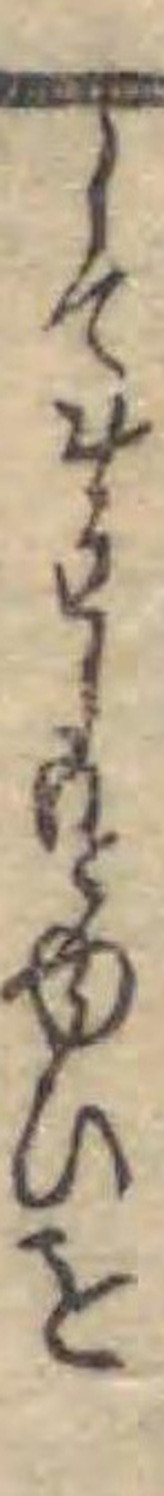してまわしもとゆひを
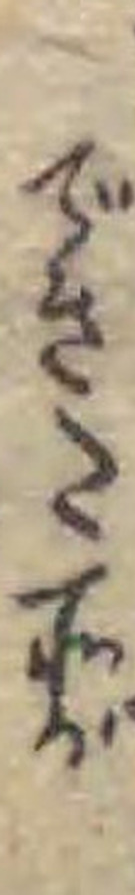できた所が
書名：紙屑身上噺 : 3巻
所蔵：国立国会図書館 National Diet Library, JAPAN
